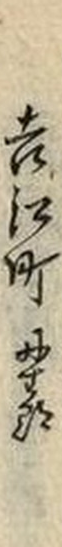吉江町丹生郡
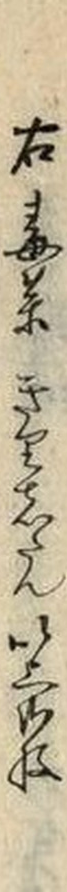右毒薬きりしたん以上弐枚
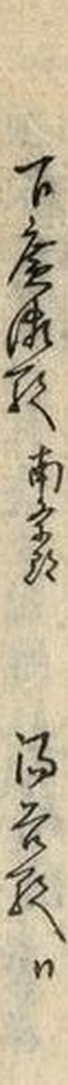下広瀬駅南条郡湯谷駅同
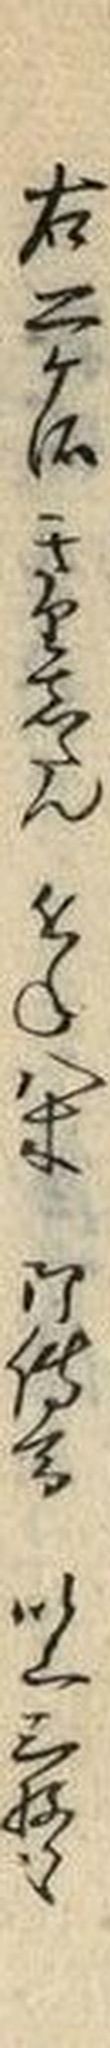右二ケ所きりしたん近年米御伝馬以上三枚ツヽ
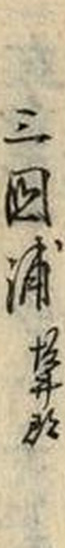三国浦坂井郡
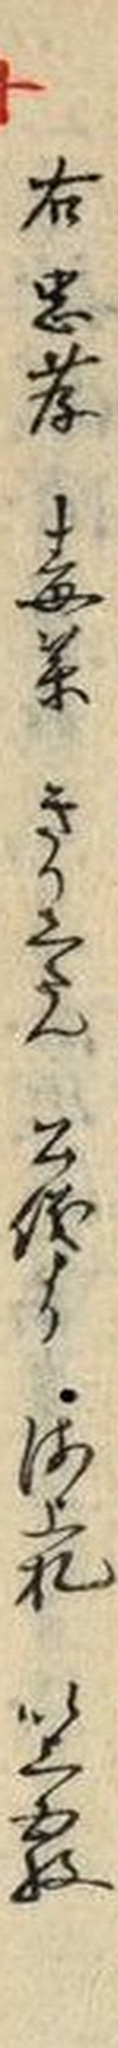右忠孝毒薬きりしたん公儀より海上札以上五枚

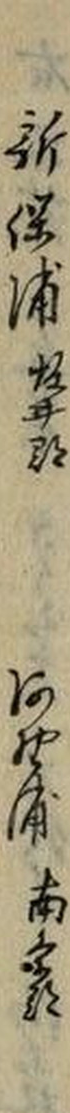新保浦坂井郡河野浦南条郡
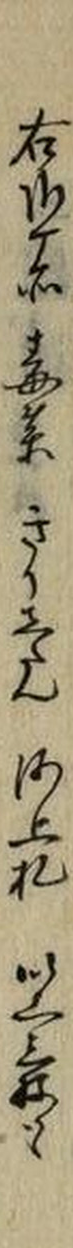右弐ケ所毒薬きりしたん河上札以上三枚ツヽ
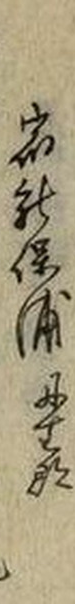宿新保浦丹生郡
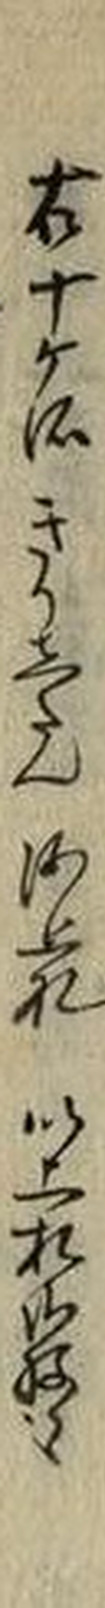右壱十ケ所きりしたん河上札以上札弐枚ツヽ
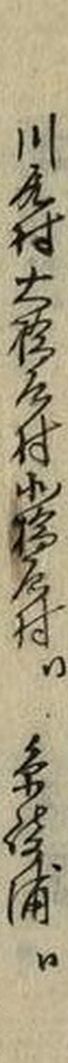白潟村同川尻村大橋屋村北橋屋村同糸崎浦同
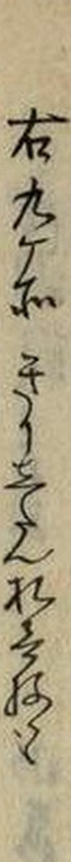右九ヶ所きりしたん札壱枚ツヽ
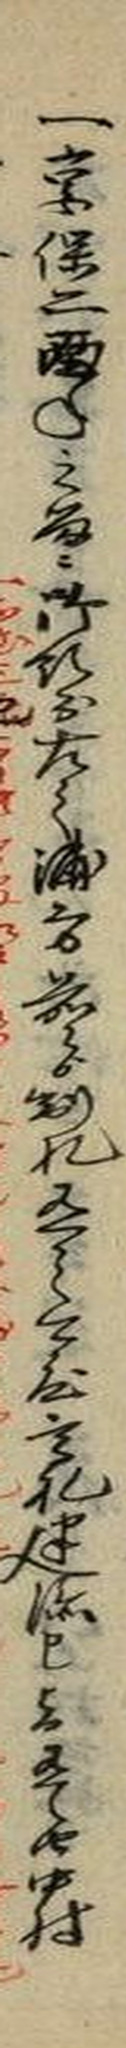一享保二酉年之留ニ御領分左之浦方前々ゟ制札有之今度高札建添申旨有之由中村
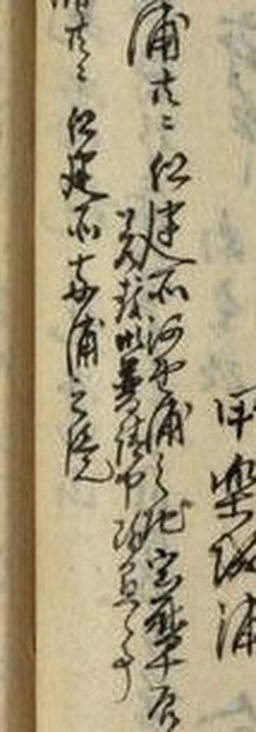差越御普請中致置候事
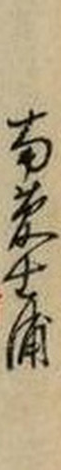南菅生浦
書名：御国他国諸事之部
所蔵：福井県文書館 Fukui Prefectural Archives
